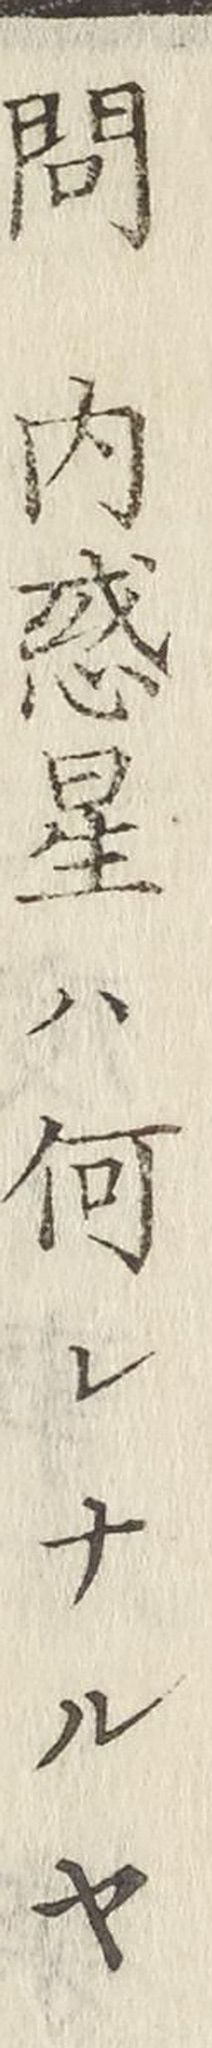問内惑星ハ何レナルヤ
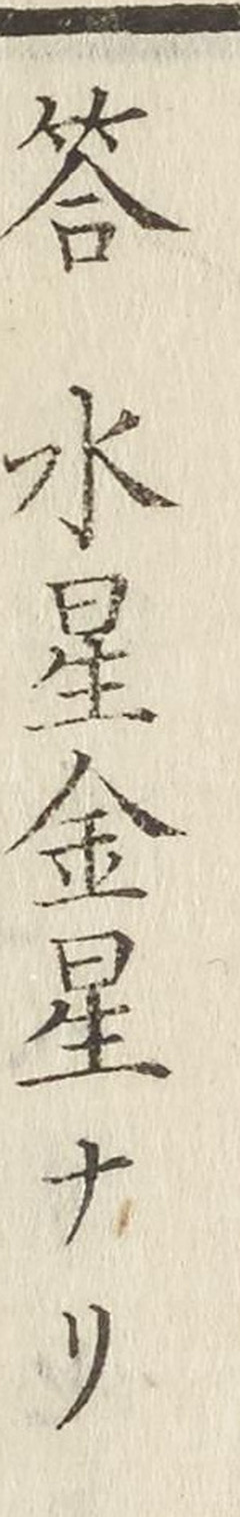答水星金星ナリ
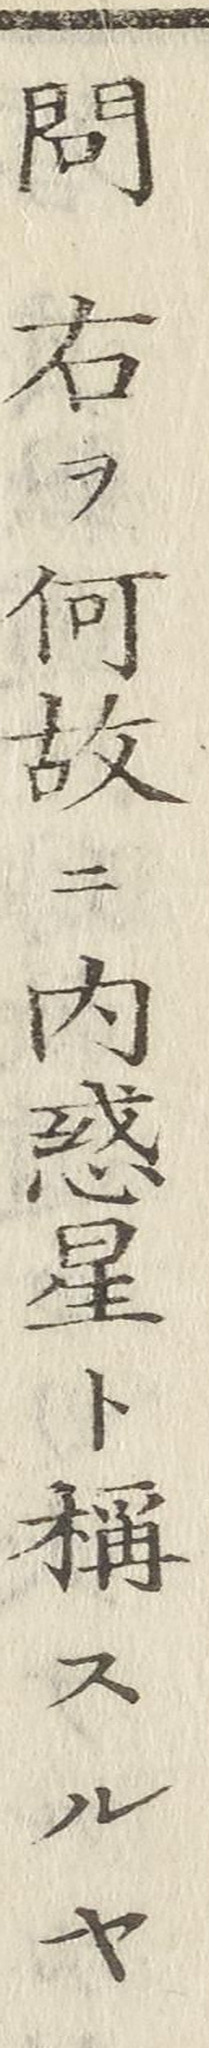問右ヲ何故ニ内惑星ト称スルヤ
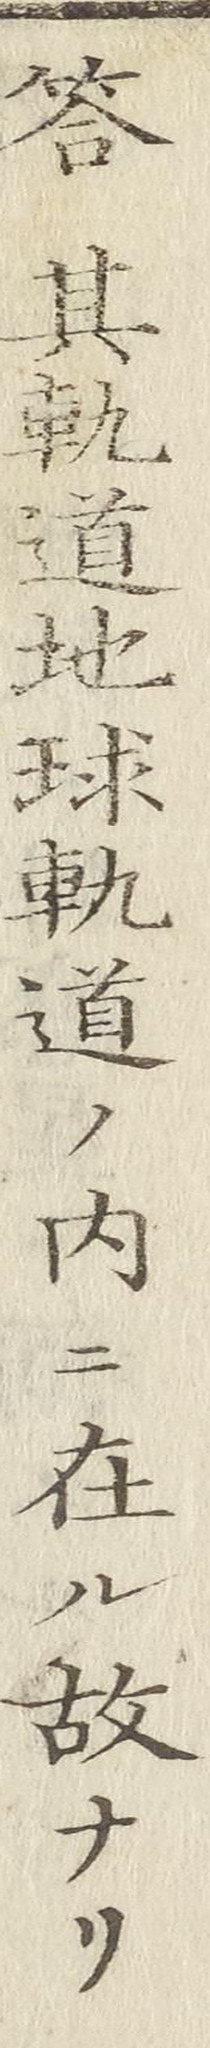答其軌道地球軌道ノ内ニ在ル故ナリ
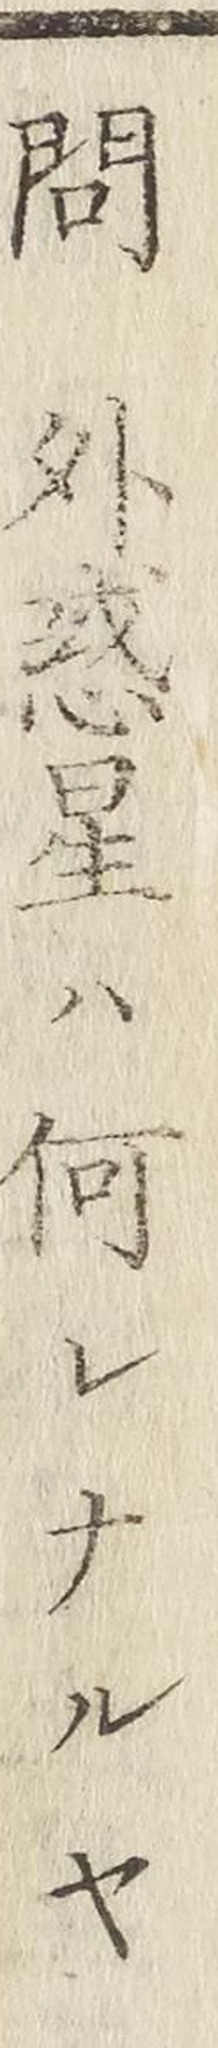問外惑星ハ何レナルヤ

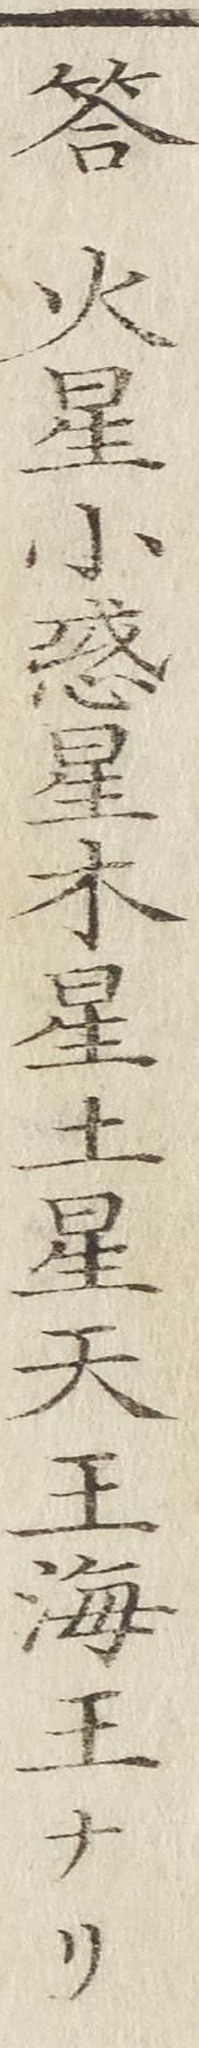答火星小惑星木星土星天王海王ナリ
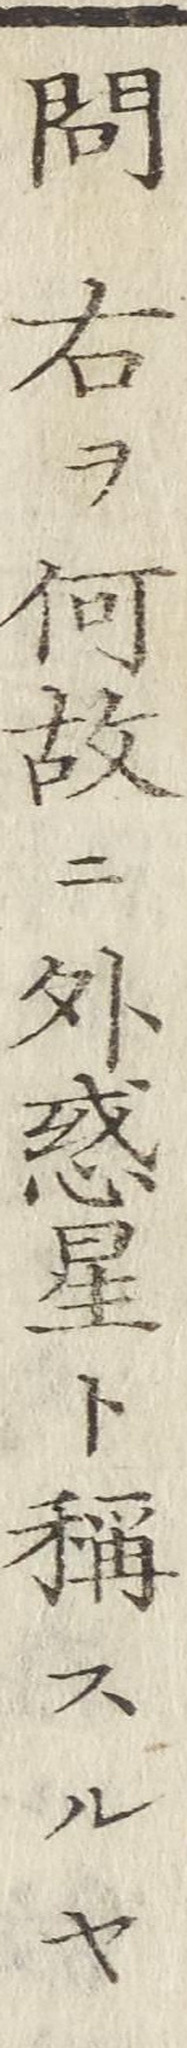問右ヲ何故ニ外惑星ト称スルヤ
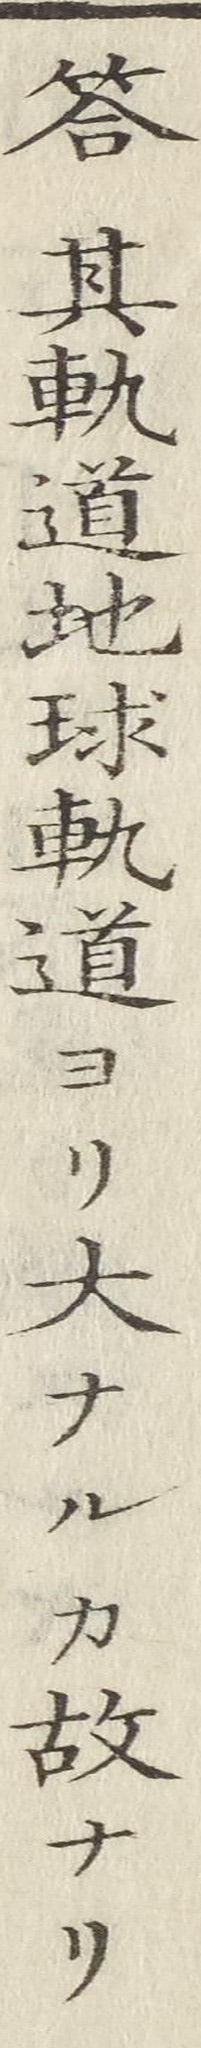答其軌道地球軌道ヨリ大ナルカ故ナリ
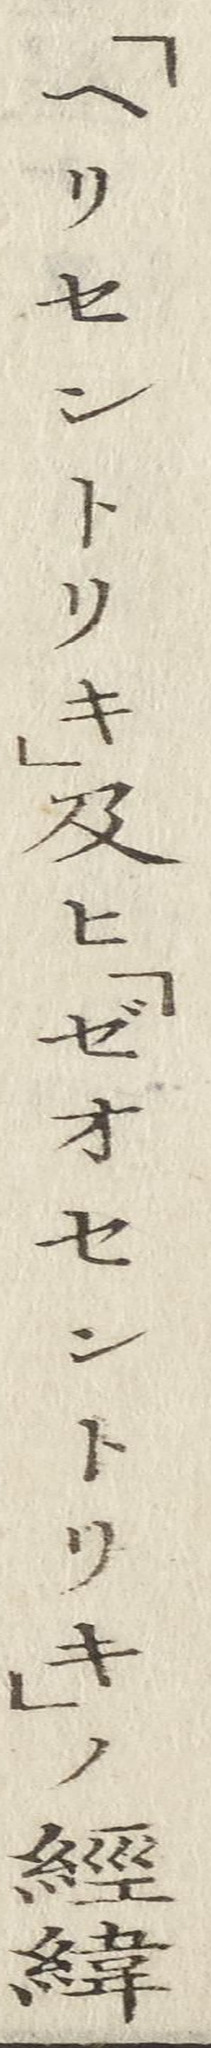「ヘリセントリキ」及ヒ「ゼオセントリキ」ノ経緯
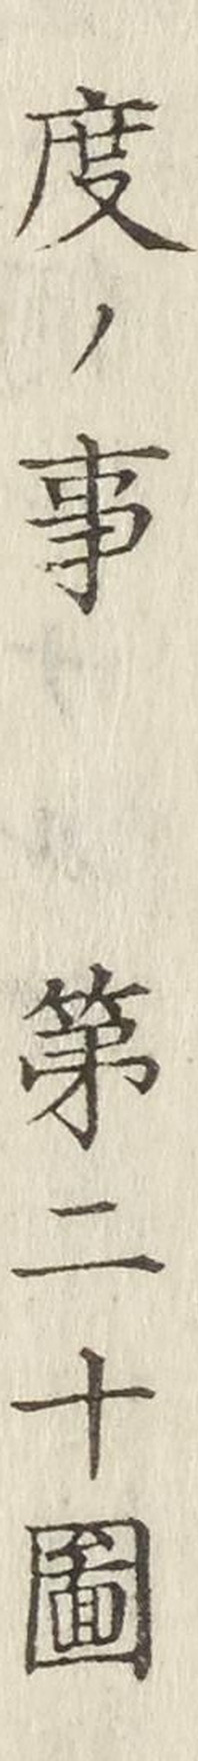度ノ事第二十図
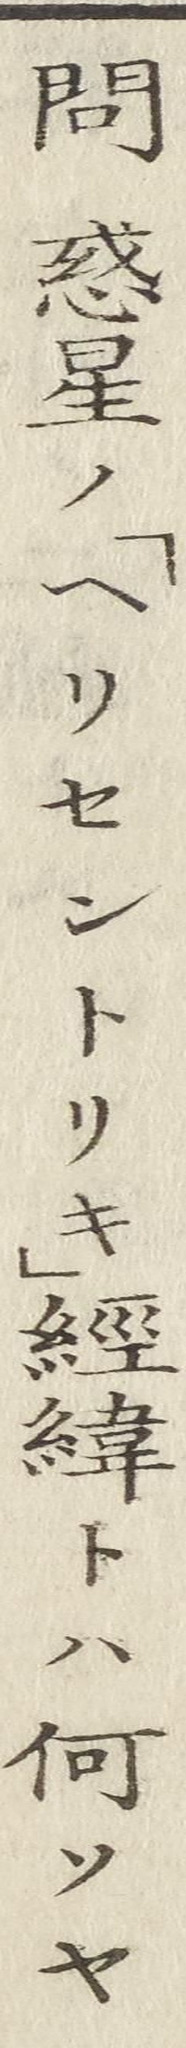問惑星ノ「ヘリセントリキ」経緯トハ何ソヤ
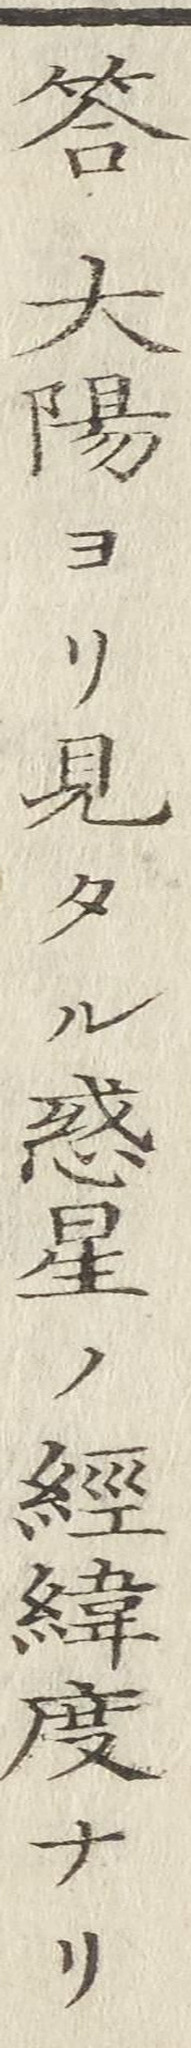答大陽ヨリ見タル惑星ノ経緯度ナリ
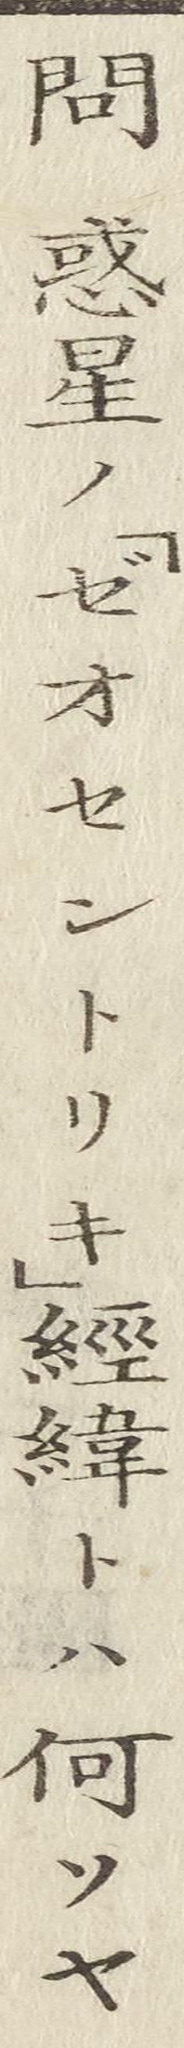問惑星ノ「ゼオセントリキ」経緯トハ何ソヤ
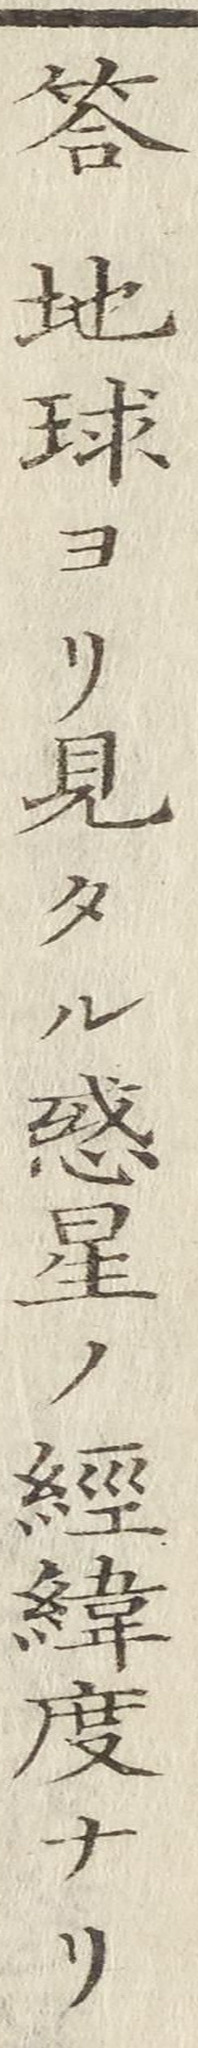答地球ヨリ見タル惑星ノ経緯度ナリ
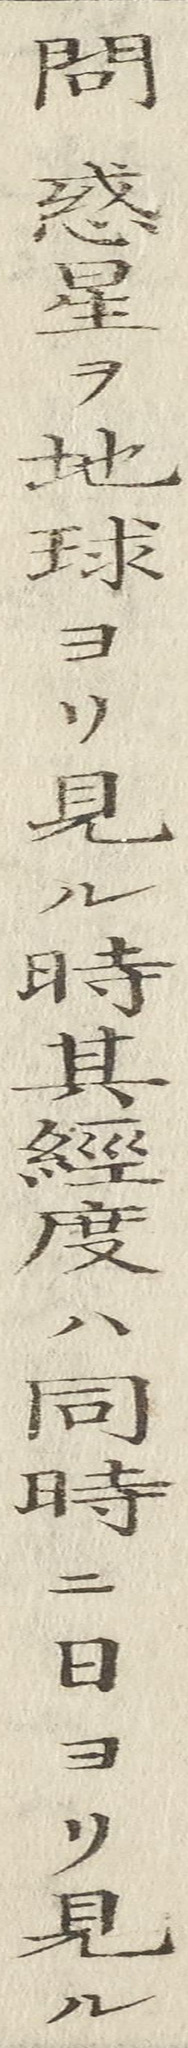問惑星ヲ地球ヨリ見ル時其経度ハ同時ニ日ヨリ見ル
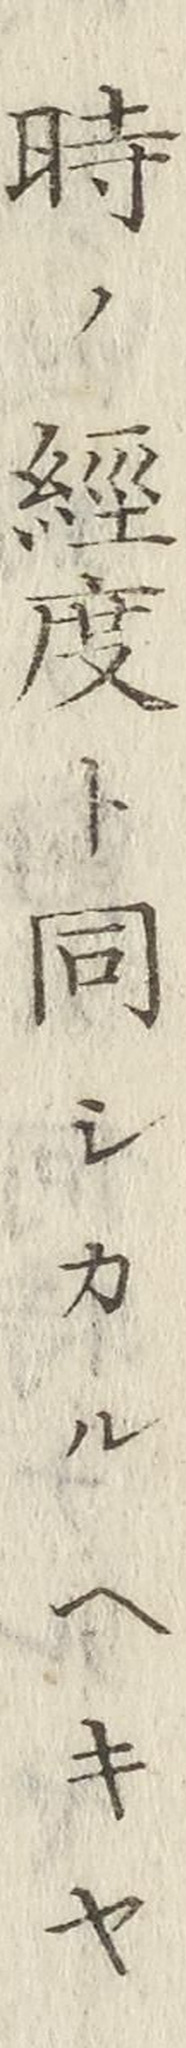時ノ経度ト同シカルヘキヤ
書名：星学圖説　下
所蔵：東京大学地震研究所図書室 Earthquake Research Institute Library, The University of Tokyo, JAPAN
